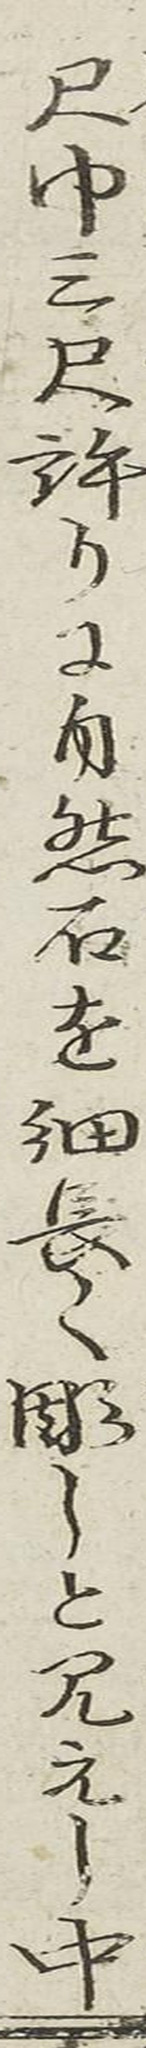尺巾三尺許りに自然石を細長く彫しと見えし中
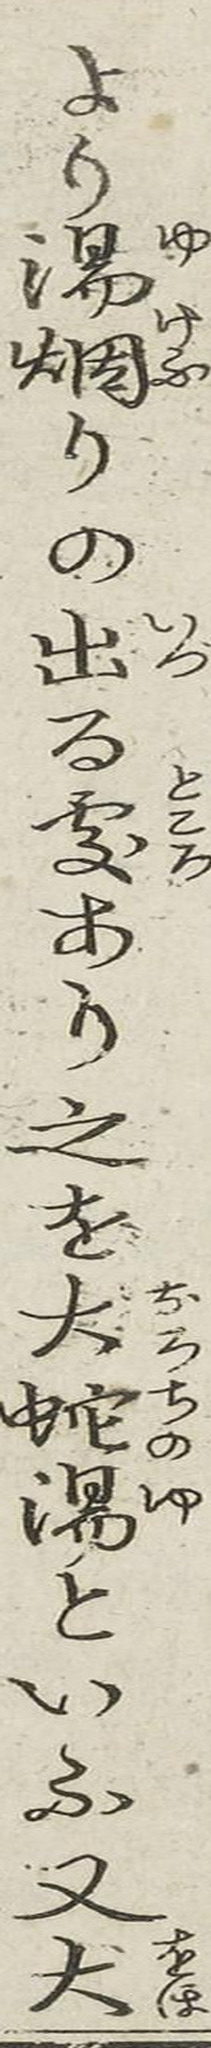より湯烟りの出る處あり之を大蛇湯といふ又大
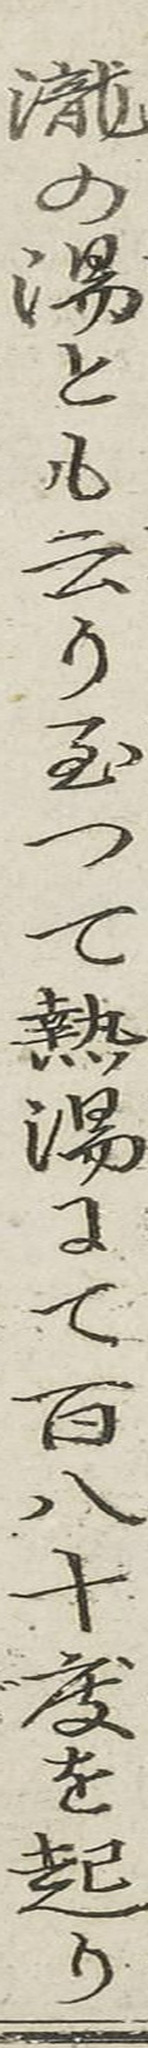瀧の湯とも云り至つて熱湯にて百八十度を起り
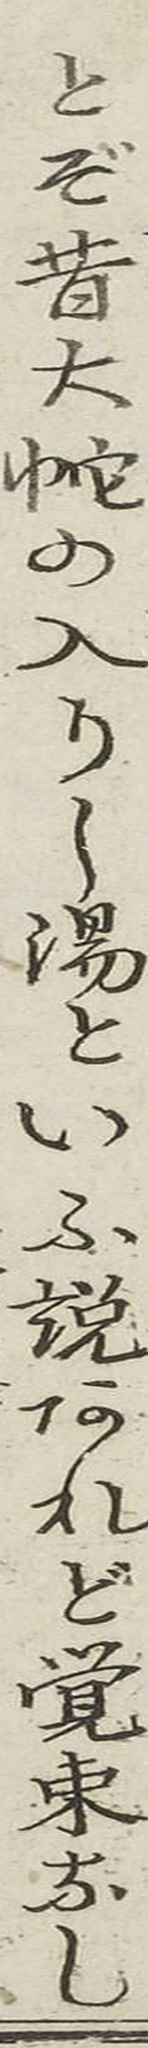とぞ昔大蛇の入りし湯といふ説なれど覚束なし
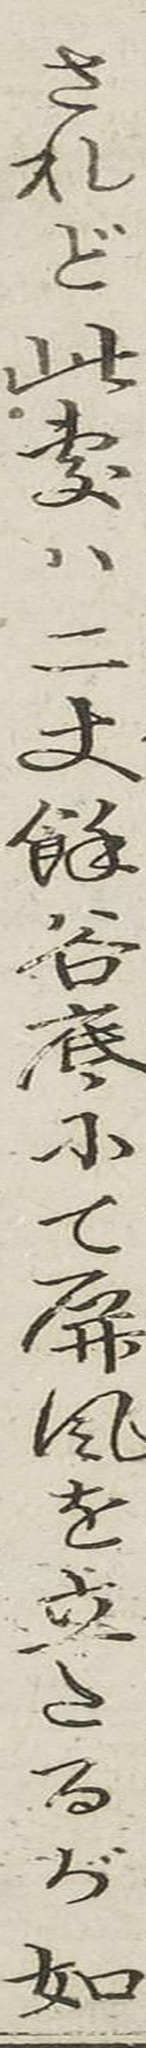されど此處は二丈餘谷底にて屏風を立たるが如
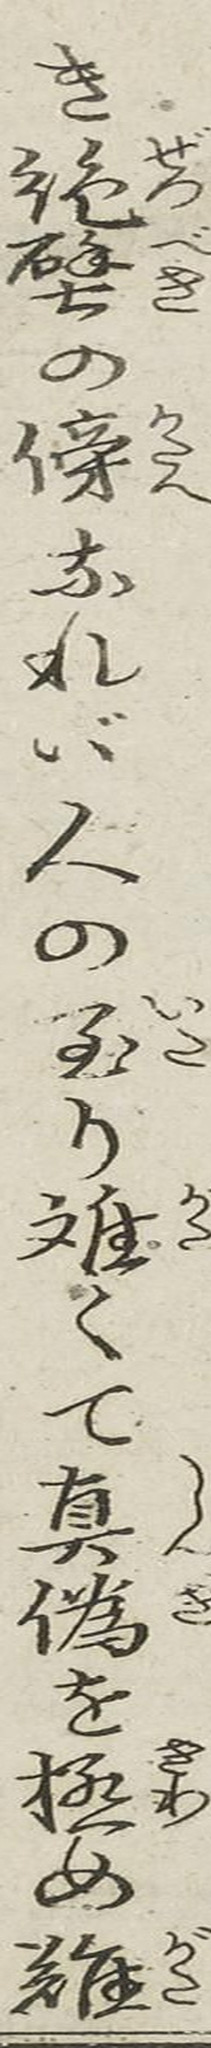き絶壁の傍なれば人の至り難くて真偽を極め難
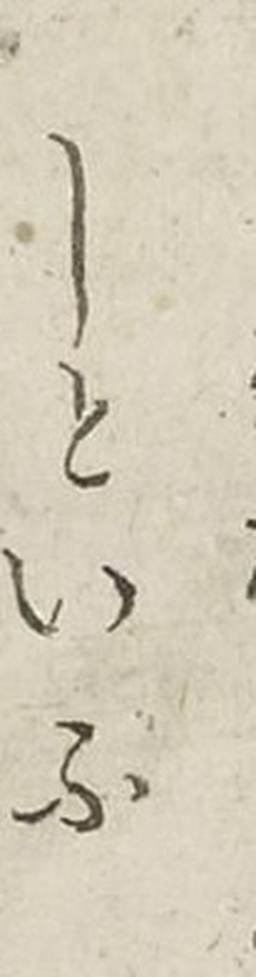しといふ
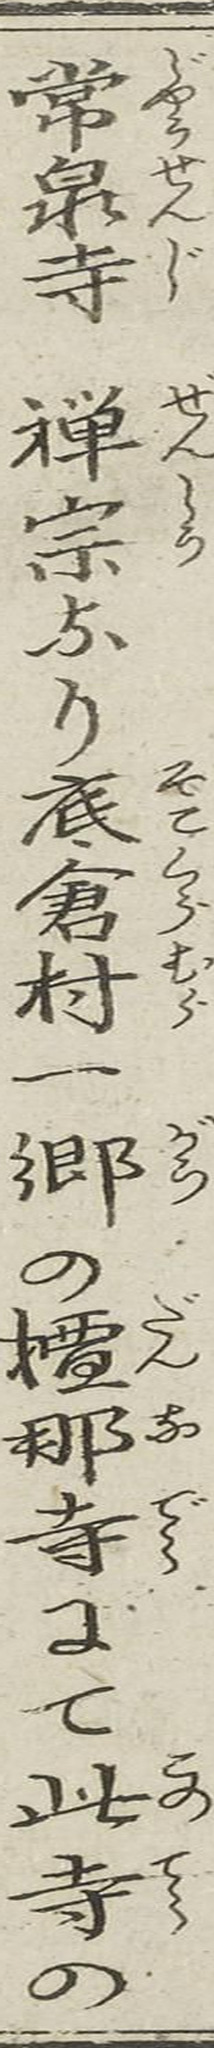常泉寺禅宗なり底倉村一郷の檀那寺にて此寺の
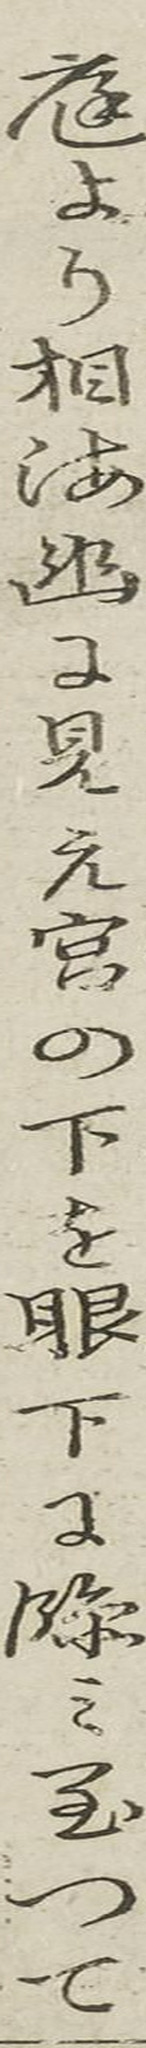庭より相海幽に見え宮の下を眼下に臨み至つて

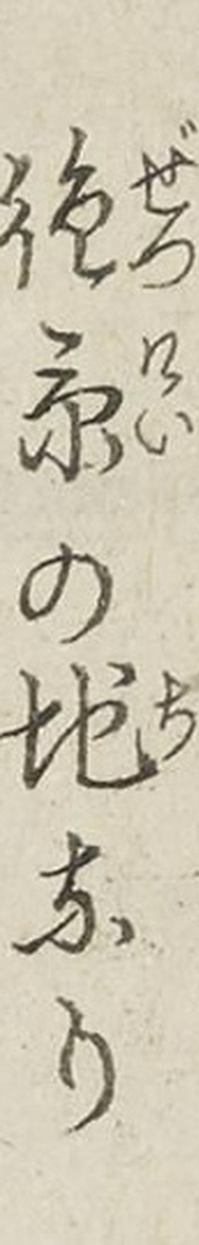絶景の地なり
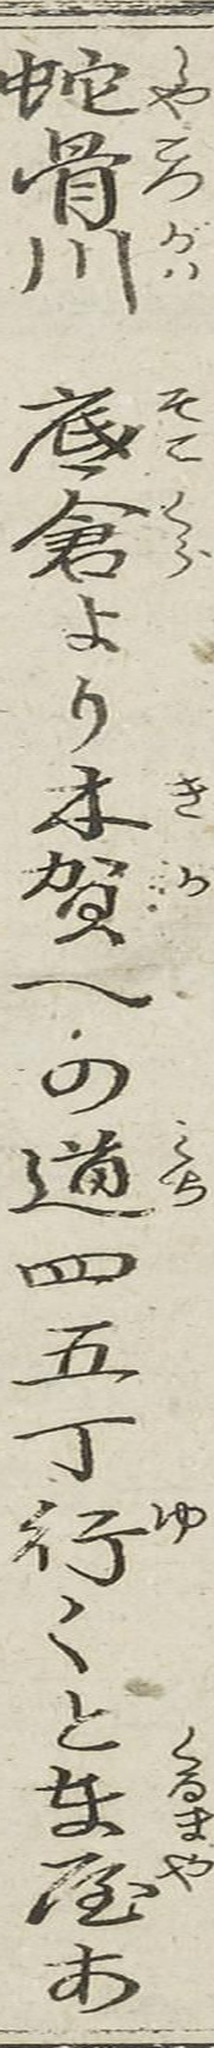蛇骨川底倉より木賀への道四五丁行くと車屋あ
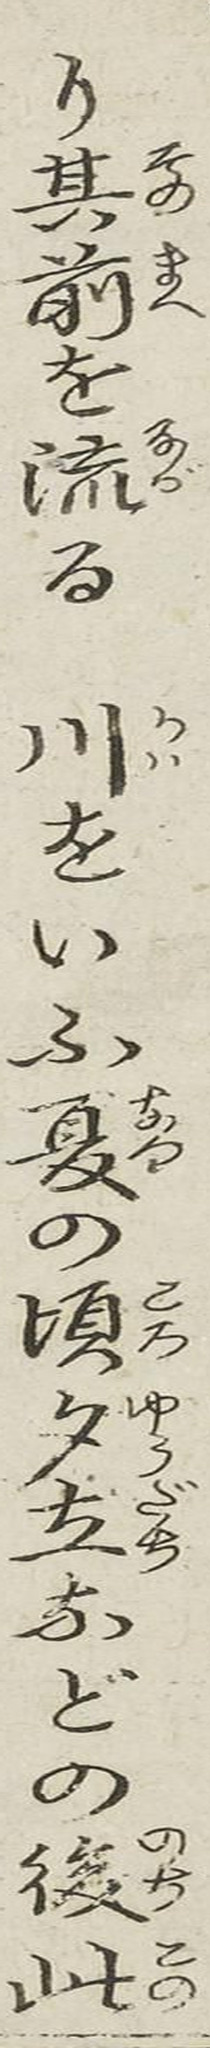り其前を流る川をいふ夏の頃夕立などの後此
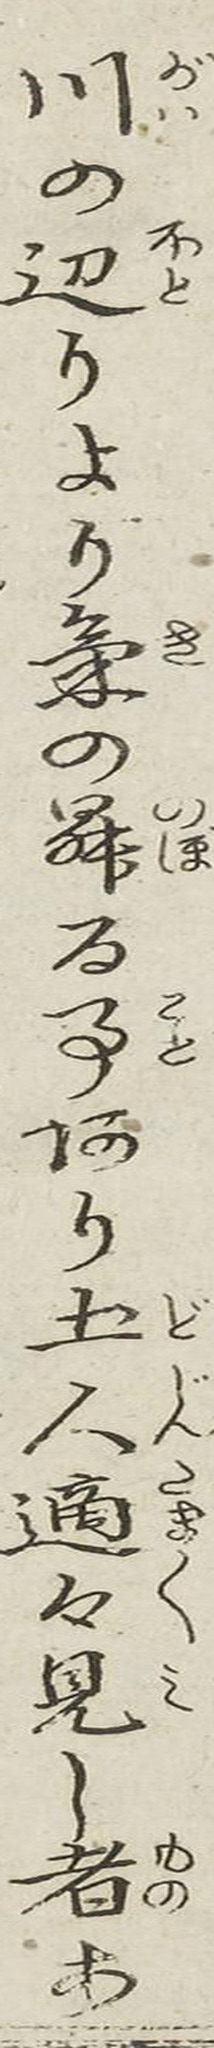川の辺りより氣の昇る事あり土人適々見し者あ
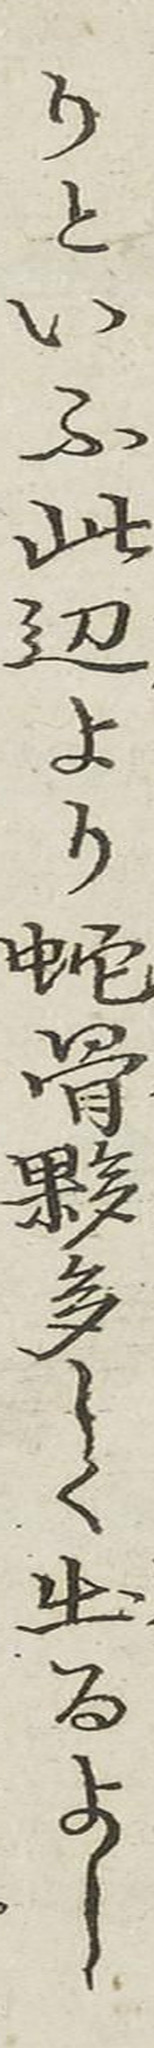りといふ此辺より蛇骨夥多しく出るよし
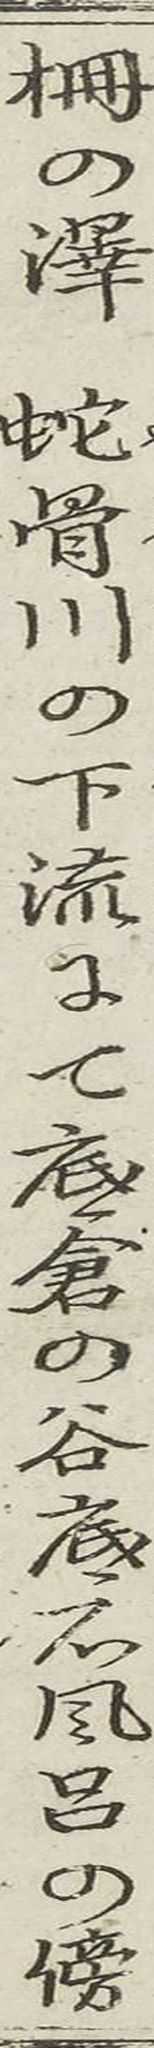柵の澤蛇骨川の下流にて底倉の谷底石風呂の傍
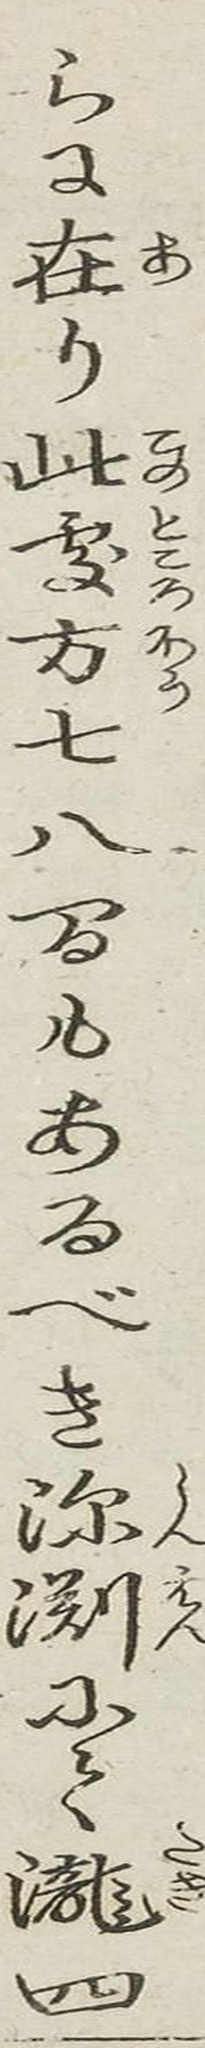らに在り此處方七八間もあるべき深淵にて瀧四
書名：箱根温泉誌　全
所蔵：東京大学地震研究所図書室 Earthquake Research Institute Library, The University of Tokyo, JAPAN
